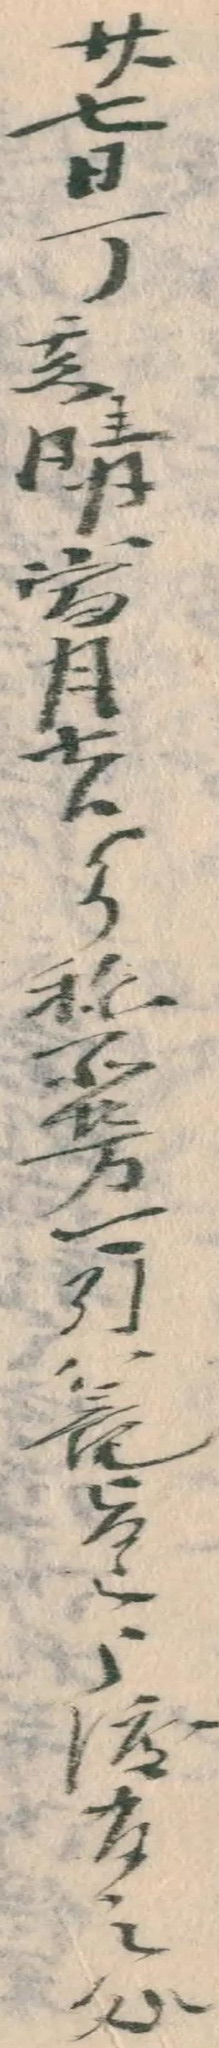廿七日丁亥晴當月七日より称所労可引篭旨被申渡有之処
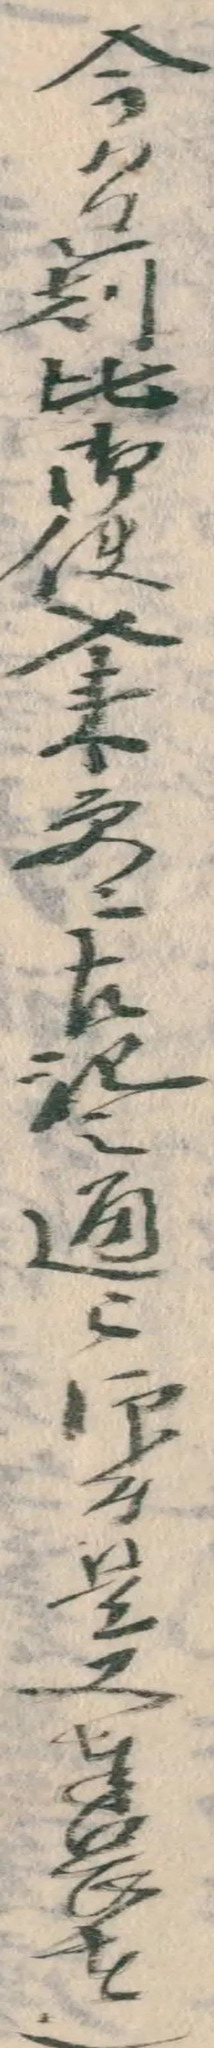今日巳刻比御使入来更に左記之通被仰付是又奉畏候也
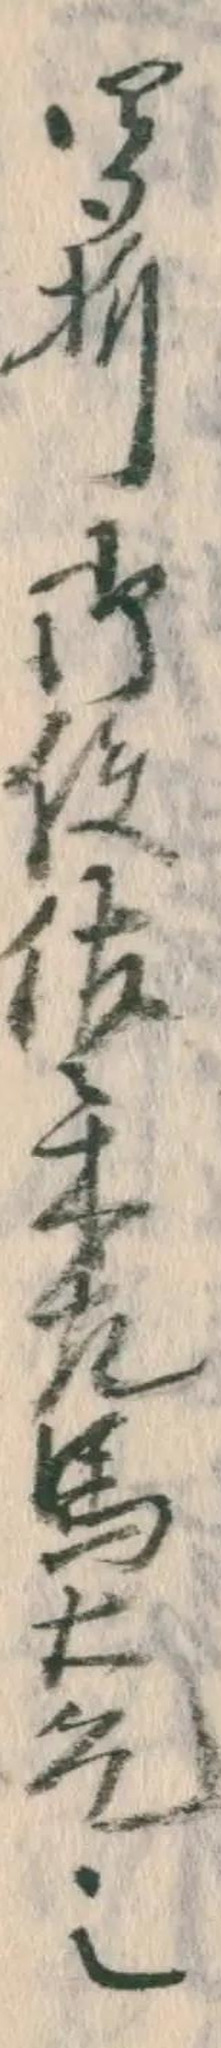四ツ折御使佐々木左馬大允也
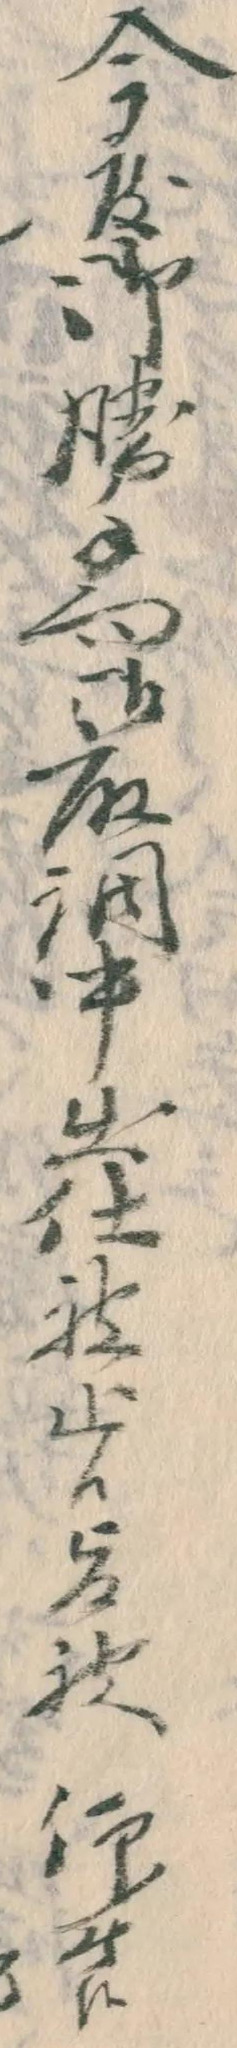今度御勝手向御取調中出仕被止候旨被仰付候事
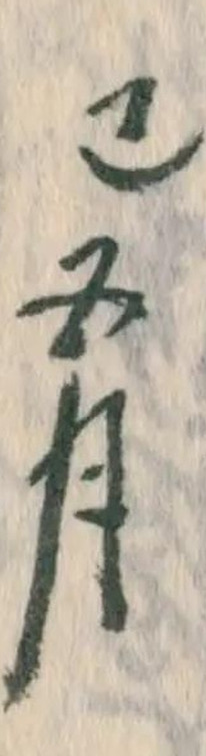巳五月
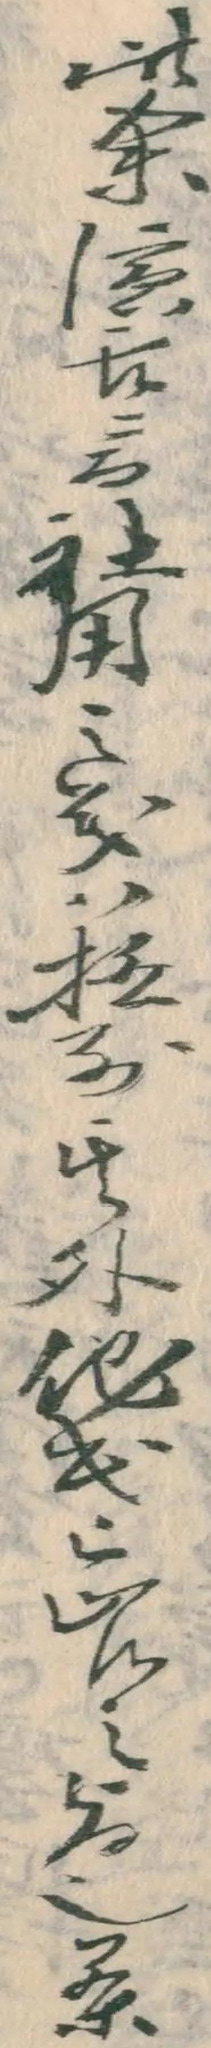此余演舌ニ而社用之義ハ格別其外他出被出候之旨也茶

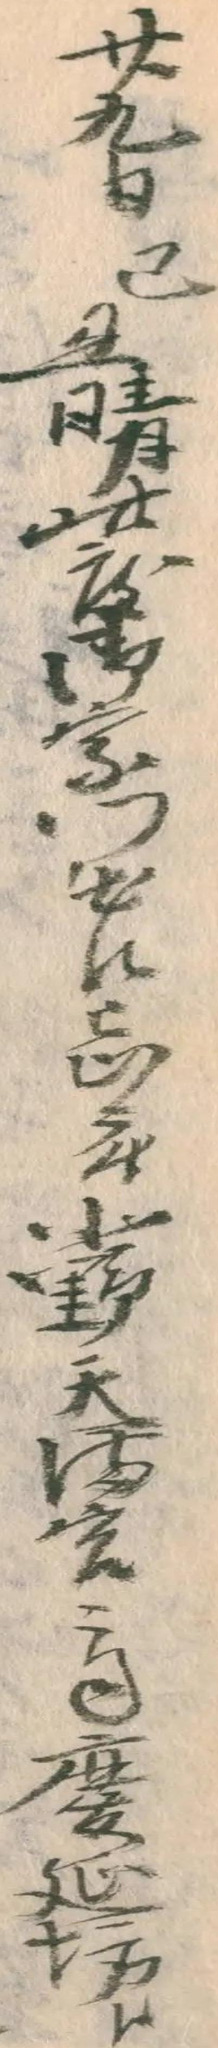廿九日己丑晴此度御家門出仕被止ニ付北野天満宮慶延坊え
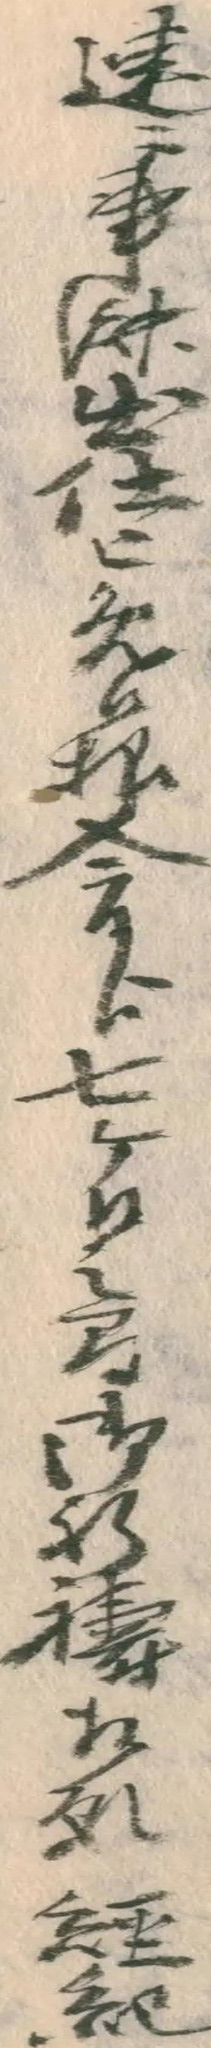速二事済出仕被免候様今日ゟ七ヶ日之間御祈祷相願経紀
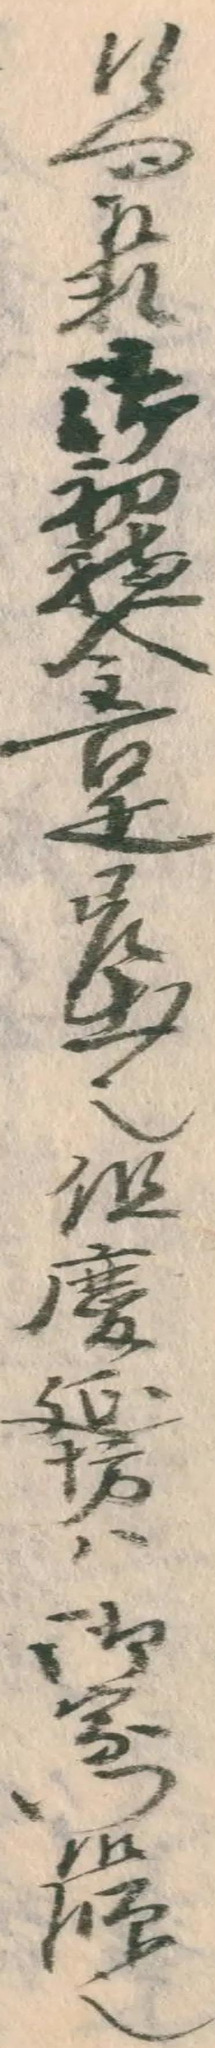行向相頼御初穂金百疋差出也但慶延坊ハ御家門御師也
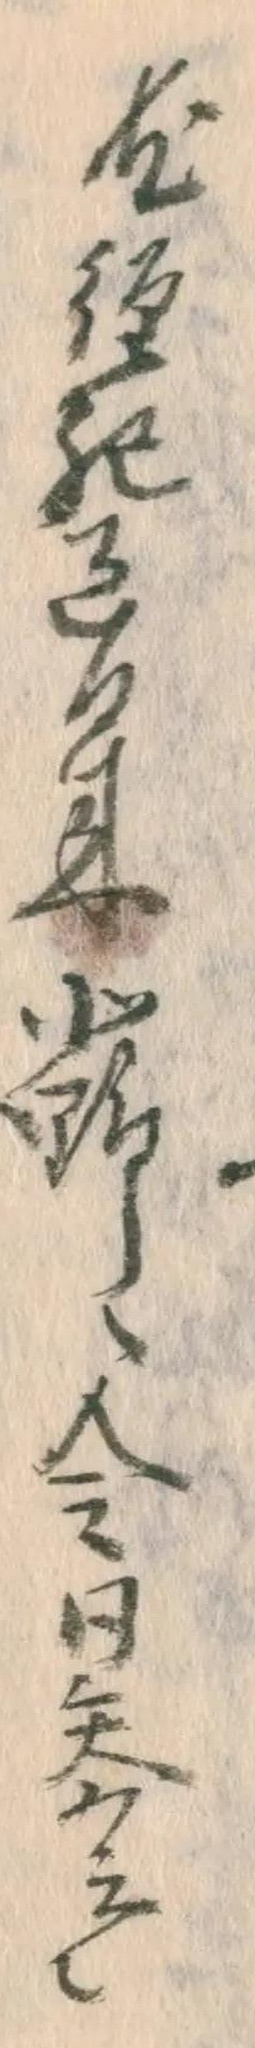尤経紀過日来北野へ令日参云々
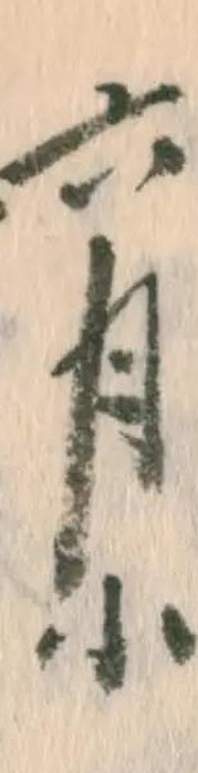六月小
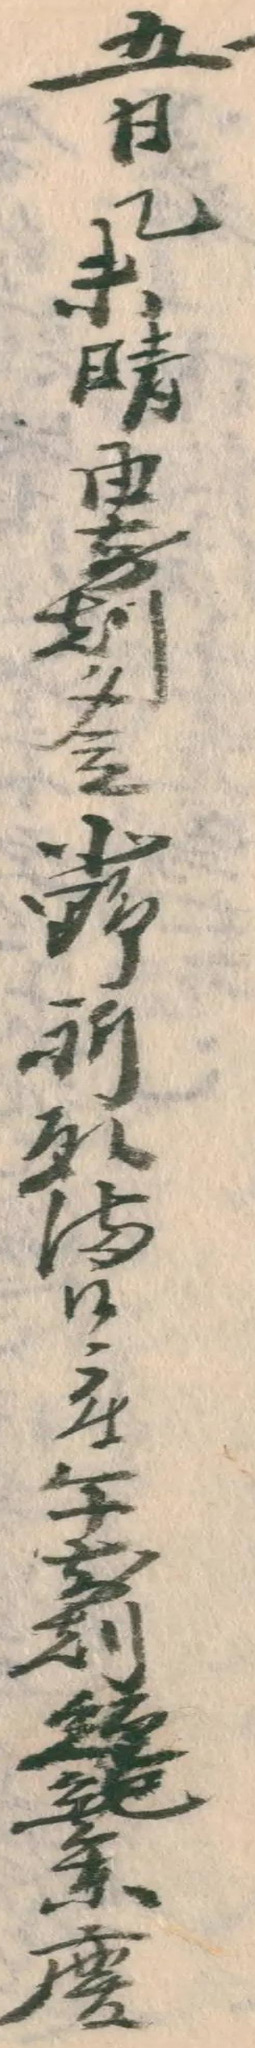五日乙未晴申前刻夕立北野祈願満日ニ付午前刻経紀参慶
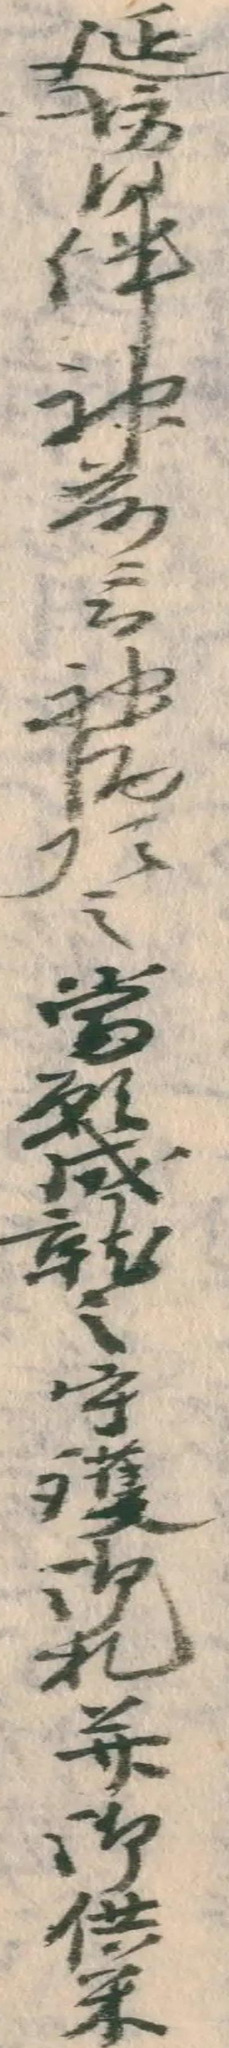延坊同伴神前ニ而神酒頂之當願成就之守護御礼并御供米
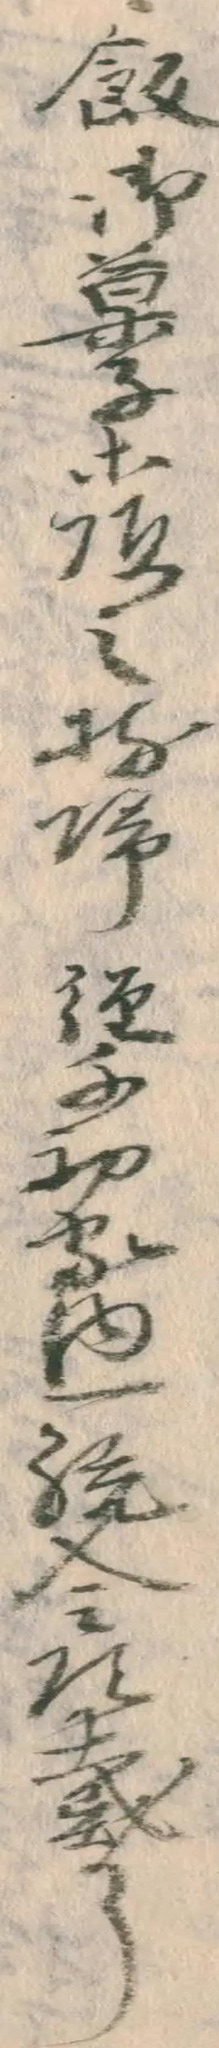飯御菓子等頂之持帰経千初家内一統令頂戴了
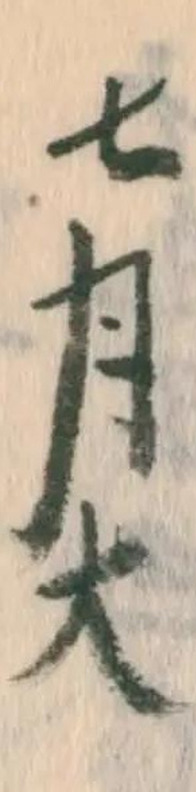七月大
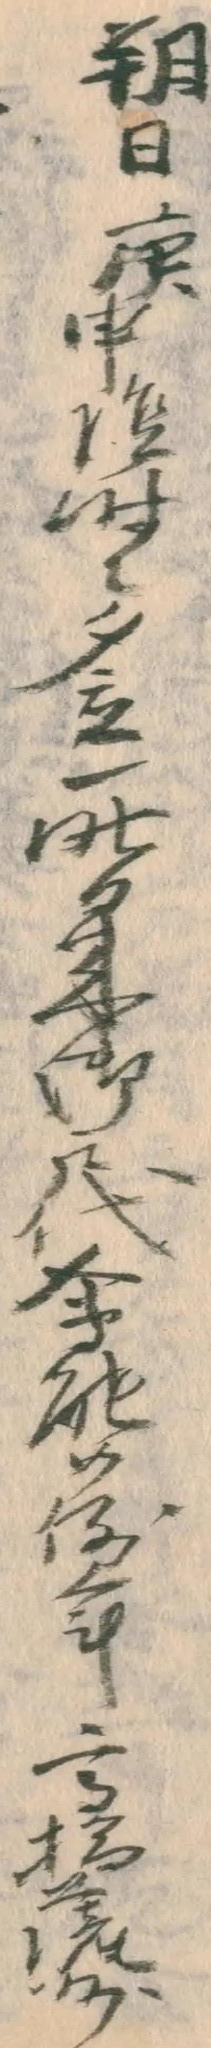朔日庚申陰時ニ夕立一昨日来御戸代會能如例年高橋薩州
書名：賀茂社記録. 第70冊
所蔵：国立国会図書館 National Diet Library, JAPAN
